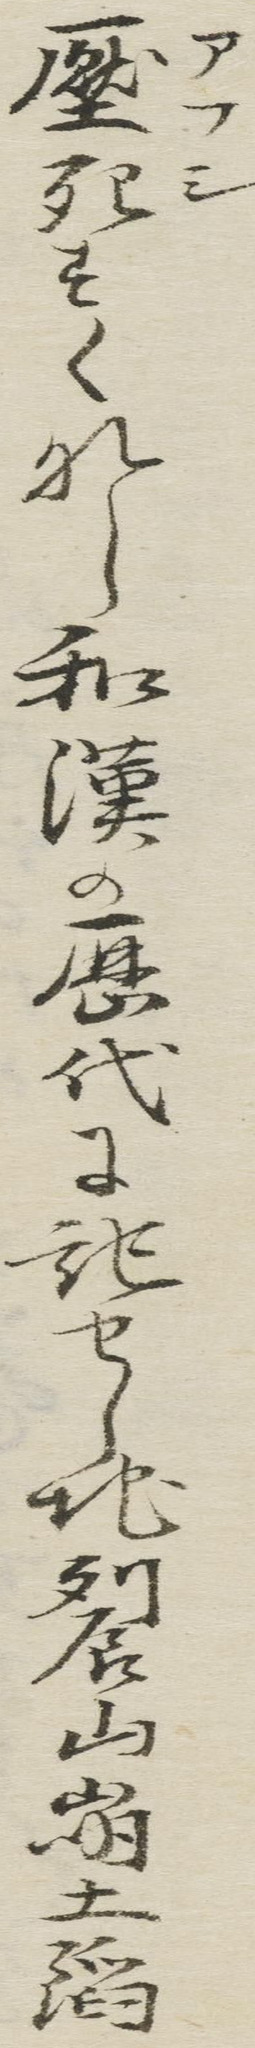圧死すくなし和漢の歴代に記せり地裂山崩れ土焔
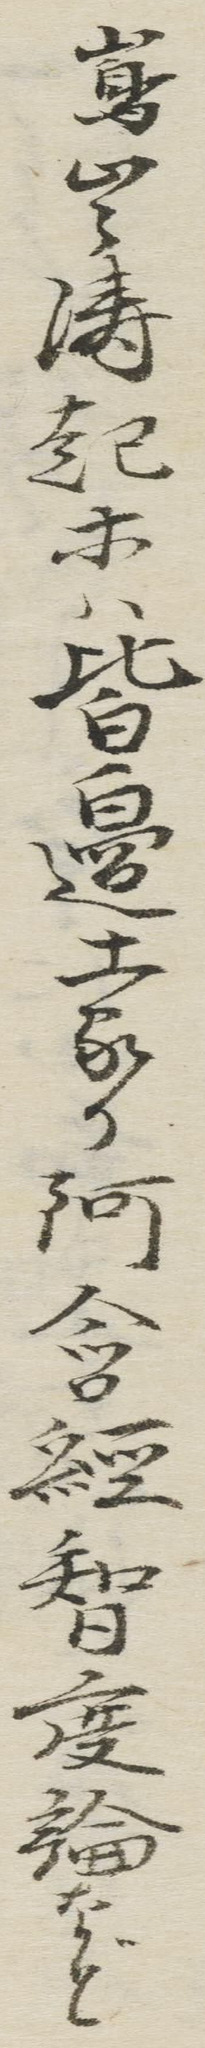嶋出涛起等ハ皆邊土也阿含経智度論など
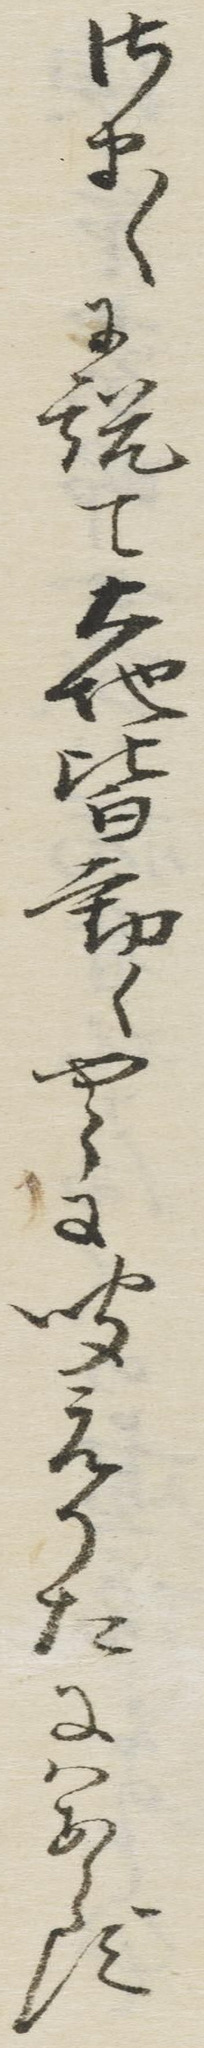さま〳〵に説て大地皆動くやうに聞えりたるハあらず
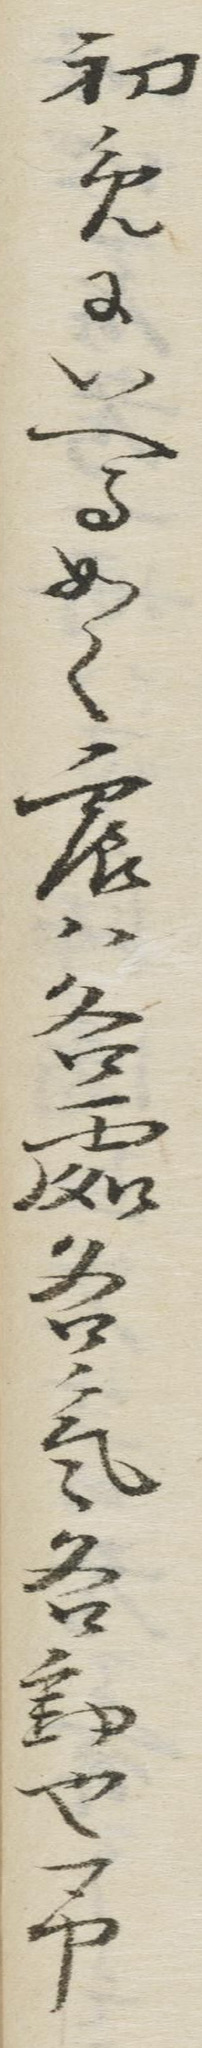初めにいへる如く震ハ各処各気各動や予
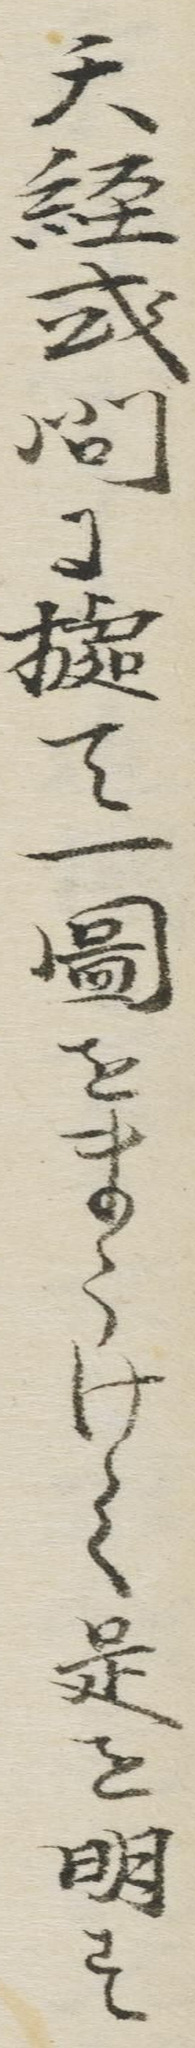天経或問に拠て一図をまうけて是を明す
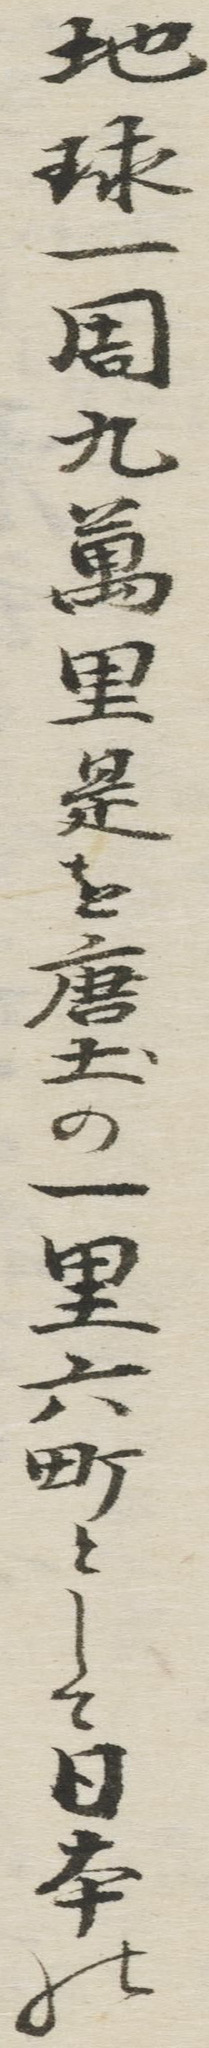地球一周九萬里是を唐土之一里六町として日本の
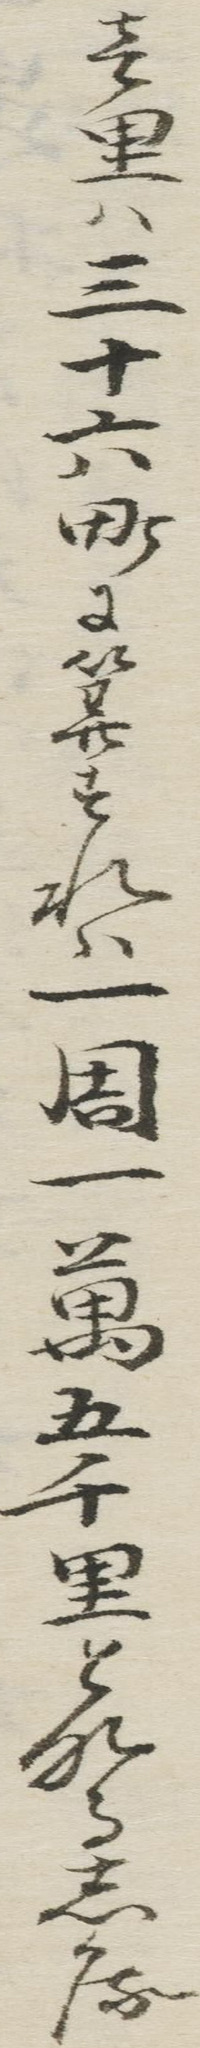壱里ハ三十六町に算すれハ一周一萬五千里となるしかる
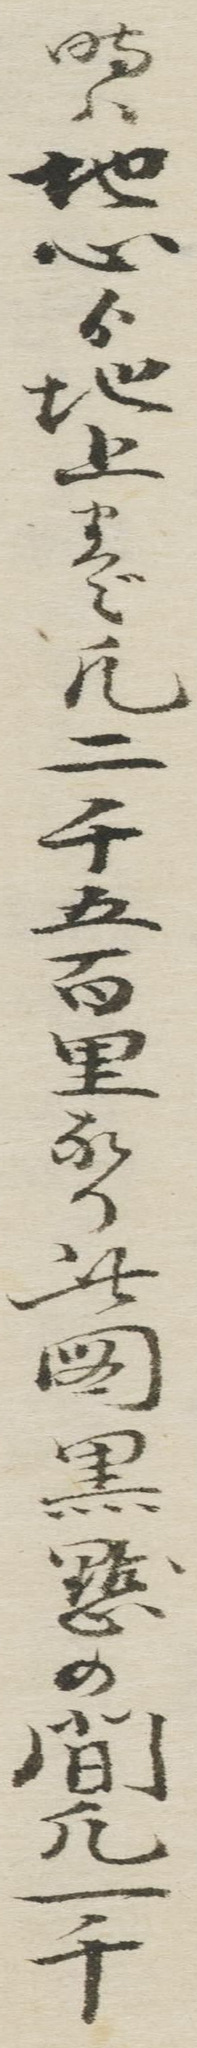時ハ地心ゟ地上まで凡二千五百里なり此図黒点の間凡一千
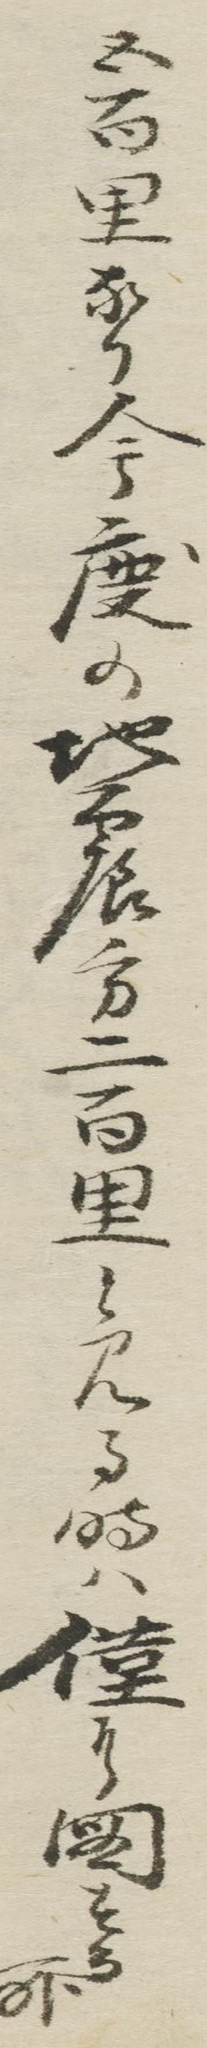五百里なり今度の地震方二百里と見る時ハ僅に図する所

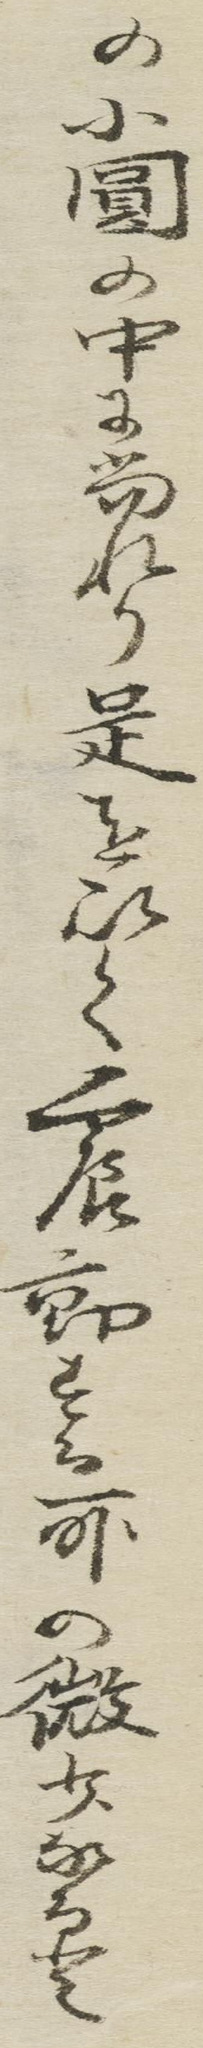の小円の中に留れり是を以て震動する所の微少なると
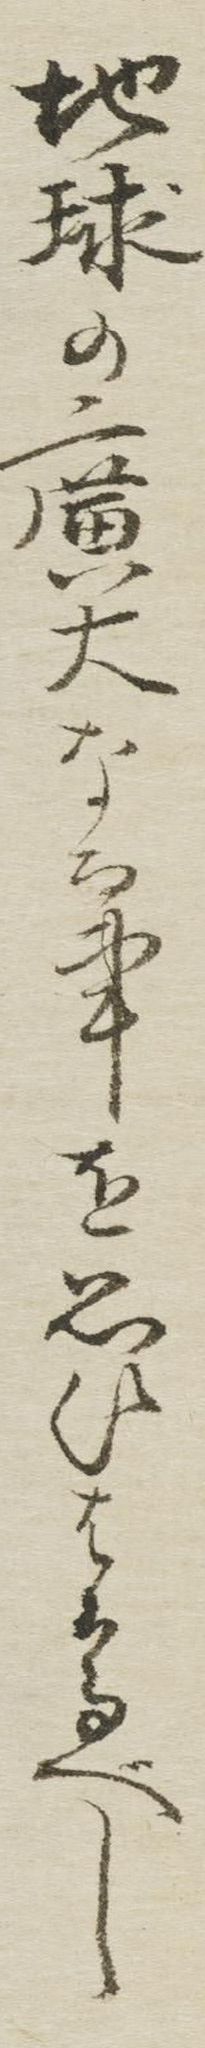地球の広大なる事を思ひはかるべし
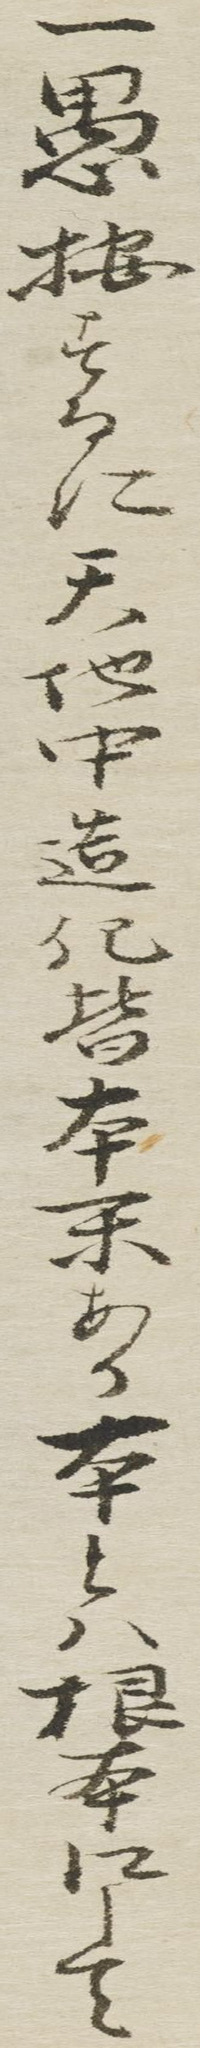一愚按ずるに天地中造化皆本にして末あり本とハ根本にして
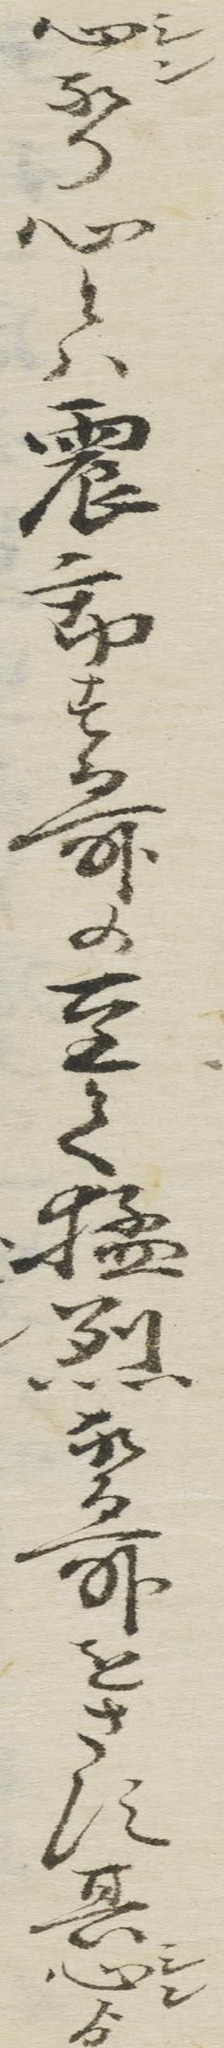心なり心とハ震動する所の至て猛烈なる所をさす其心ゟ
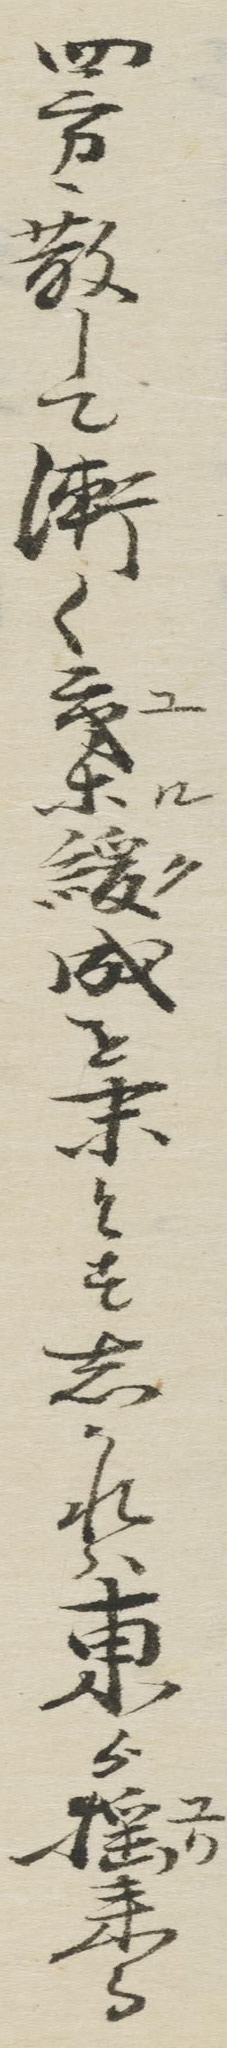四方へ散じて漸く柔緩成を末とすしかれハ東ゟ揺来る
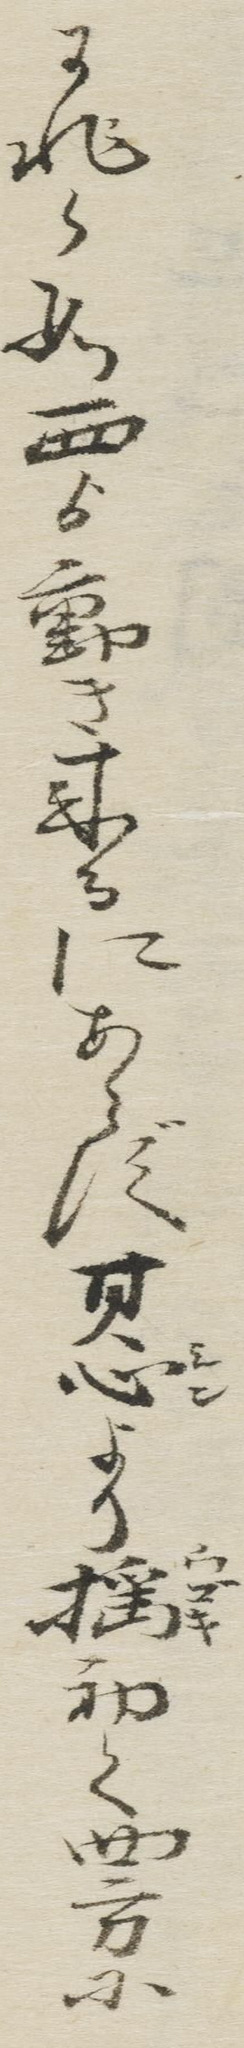に非らず西ゟ動き来るにあらず其心より揺初て四方に
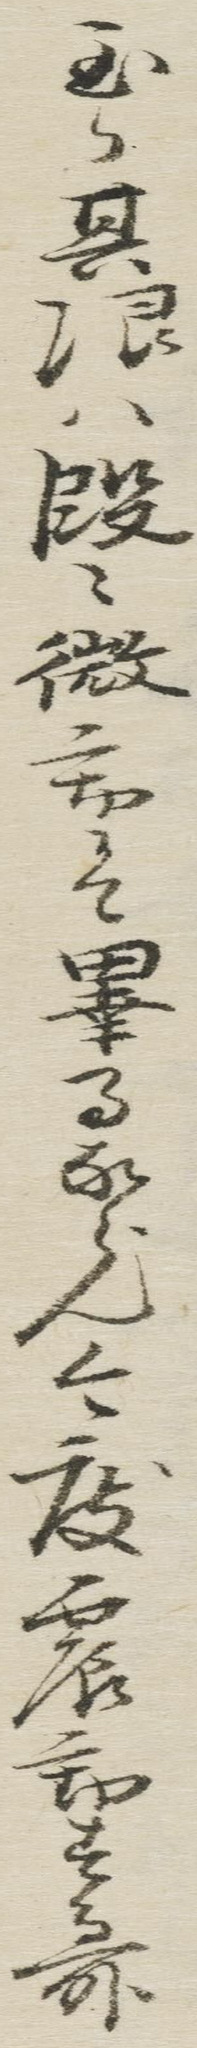至り其浪ハ段々微動にて畢るならん今度震動する所
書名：諸国大地震大津波一代記
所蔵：東京大学地震研究所図書室 Earthquake Research Institute Library, The University of Tokyo, JAPAN
